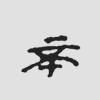不
